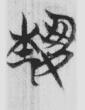埶
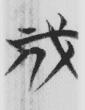戍
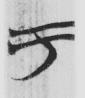于
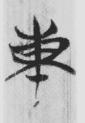東
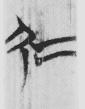𡰥
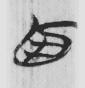西
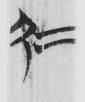𡰥
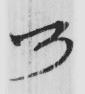乃
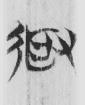{彳取}
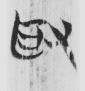取
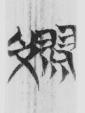{歹翏}
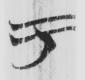于
